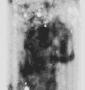芔
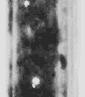木
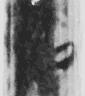㠯（以）
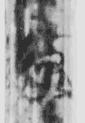﨤
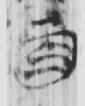百
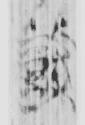{㱿字禾}
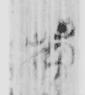茅
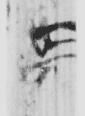長
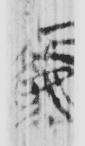繁
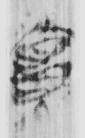實
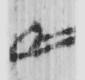亡
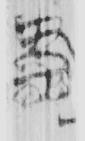{聿皕}
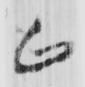㠯（以）
